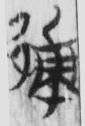郙
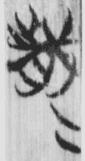歲
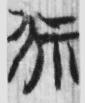𫵖
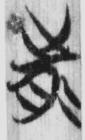之月
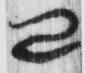己
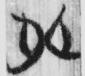卯
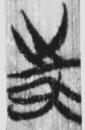之日
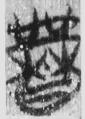○（許）
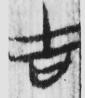吉
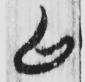㠯（以）
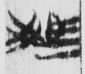駁
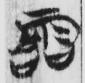霝（靈）
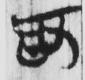爲
